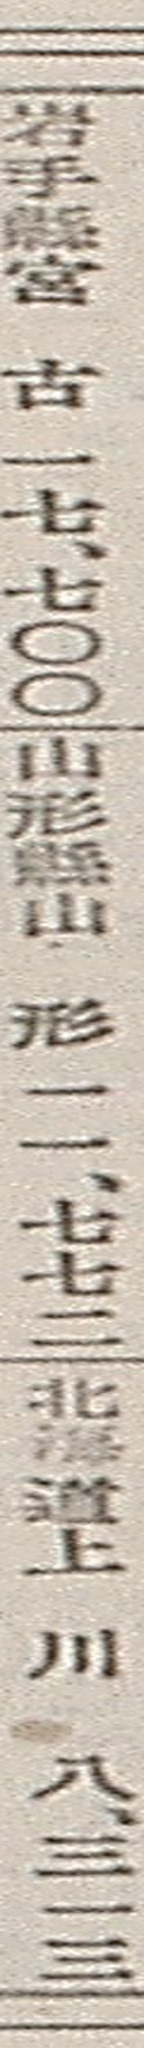岩手県宮古一七、七〇〇山形県山形一一、七七二北海道上川八、三一三
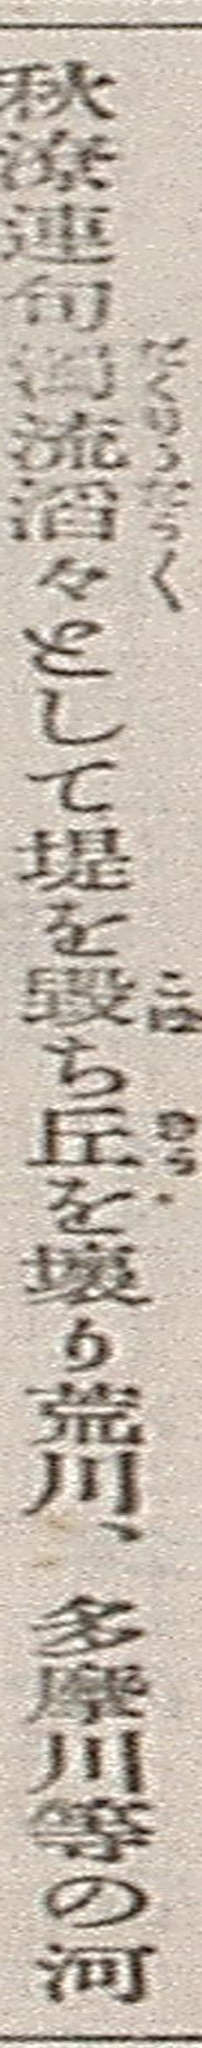秋潦連旬濁流滔々として堤を毀ち丘を壊り荒川、多摩川等の河
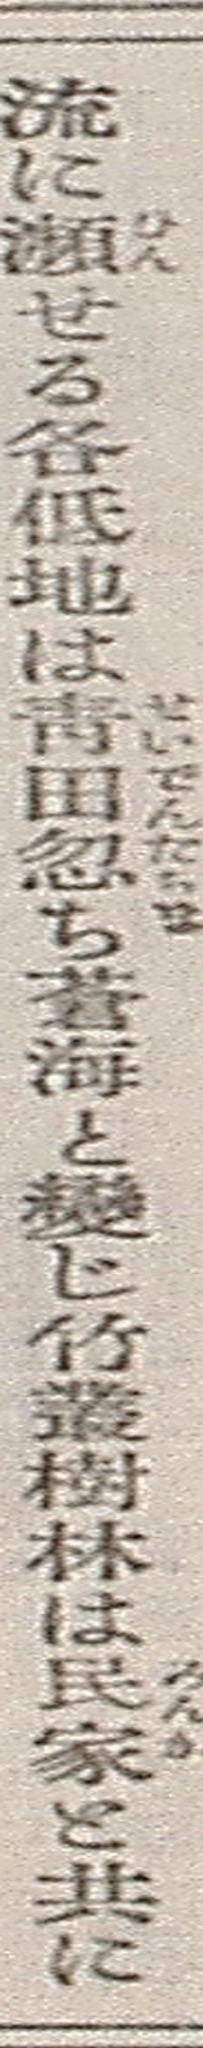流に瀕せる各低地は青田忽ち蒼海と変じ竹叢樹林は民家と共に
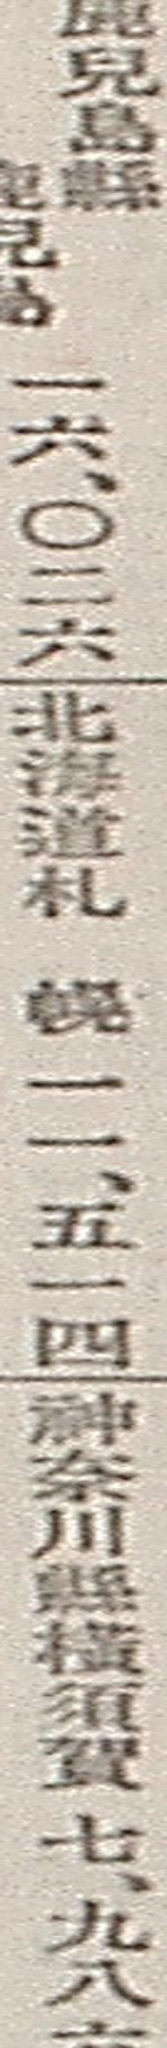鹿児島県鹿児島一六、〇二六北海道札幌一一、五一四神奈川県横須賀七、九八六
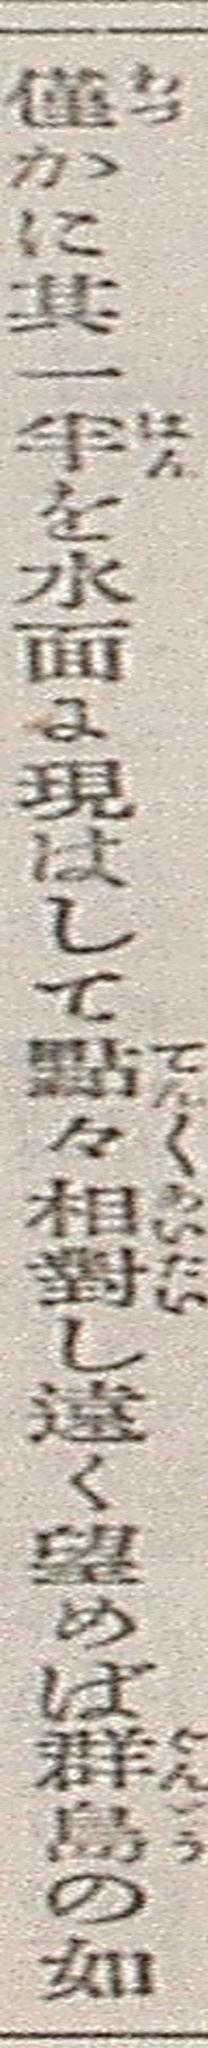僅かに其一半を水面に現はして点々相対し遠く望めば群島の如
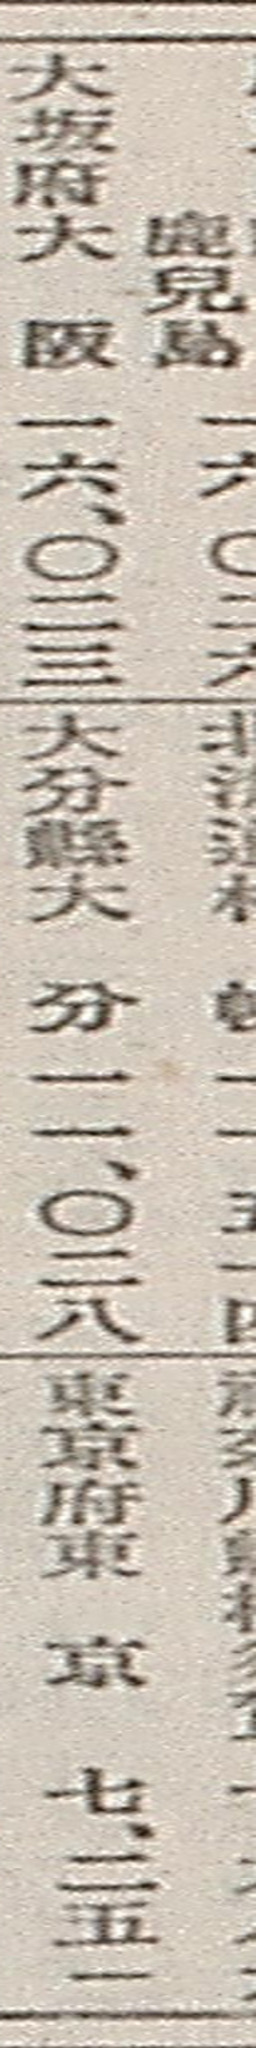大坂府大阪一六、〇二三大分県大分一一、〇二八東京府東京七、二五一
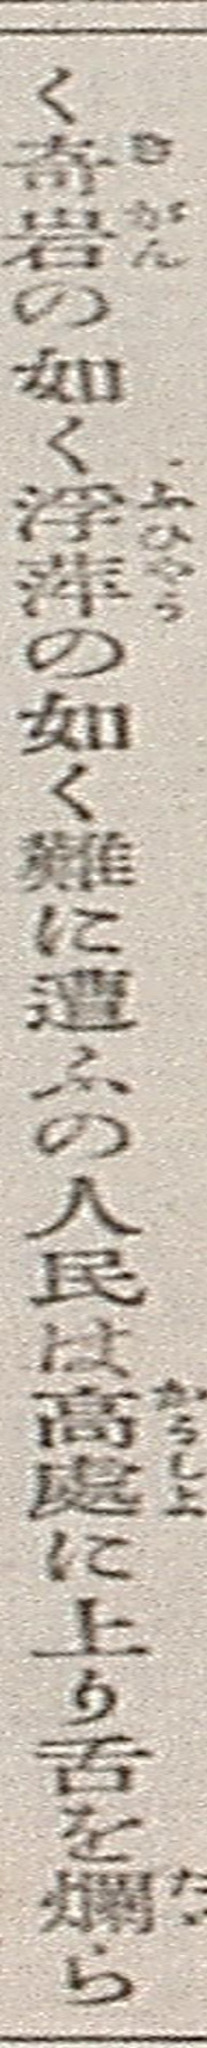く奇岩の如く浮萍の如く難に遭ふの人民は高処に上り舌を爛ら
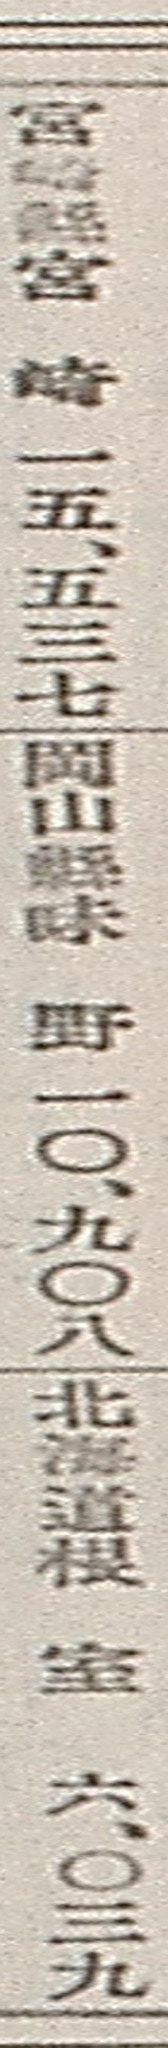宮崎県宮崎一五、五三七岡山県味野一〇、九〇八北海道根室六、〇三九
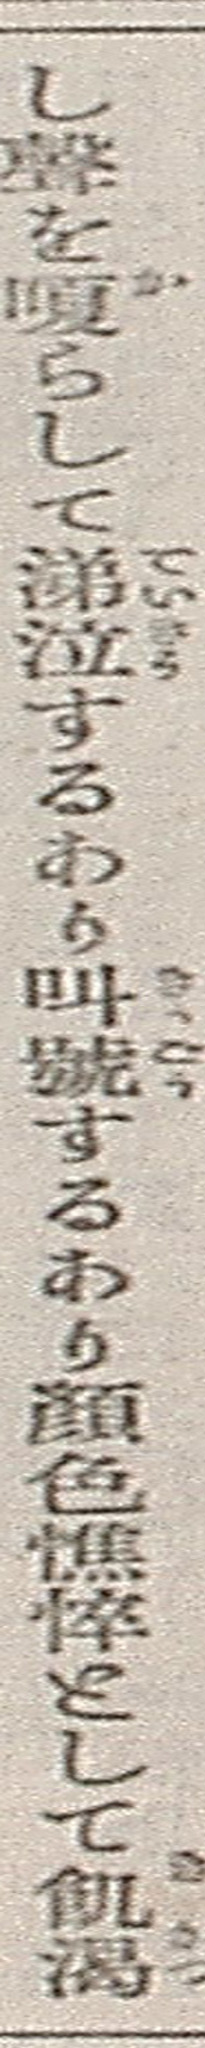し声を嗄らして涕泣するあり叫号するあり顔色憔悴として飢渇
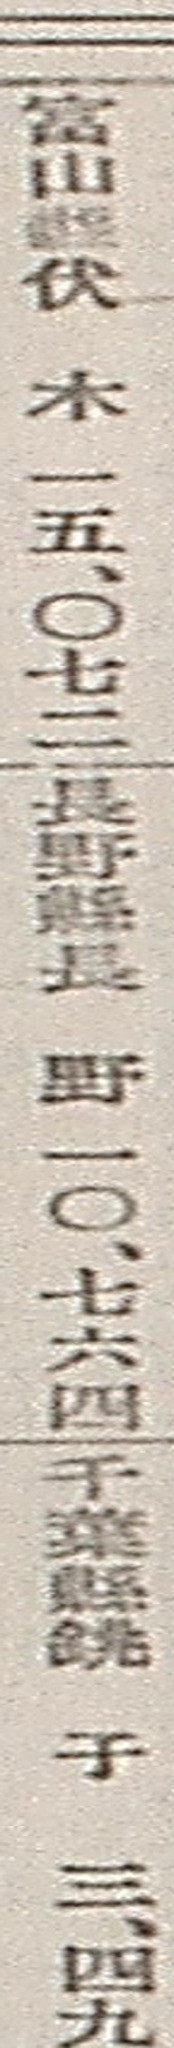富山県伏木一五、〇七二長野県長野一〇、七六四千葉県銚子三、四九八
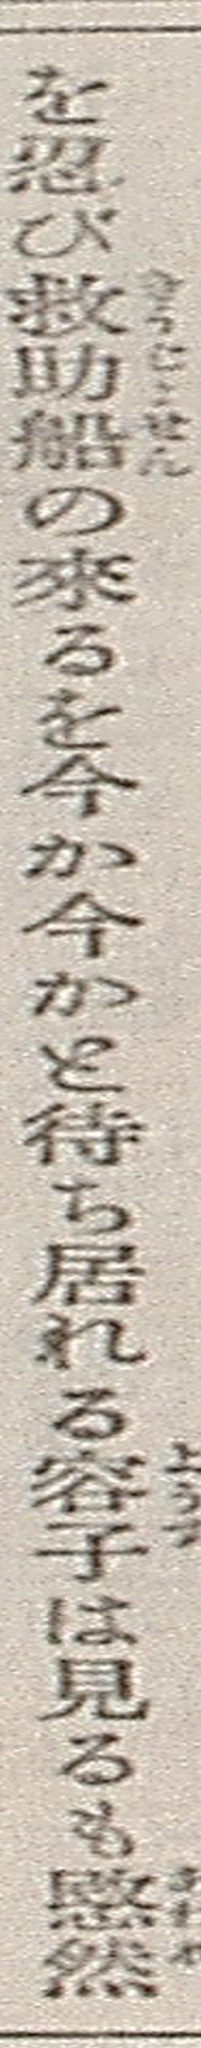を忍び救助船の来るを今か今かと待ち居れる容子は見るも愍然
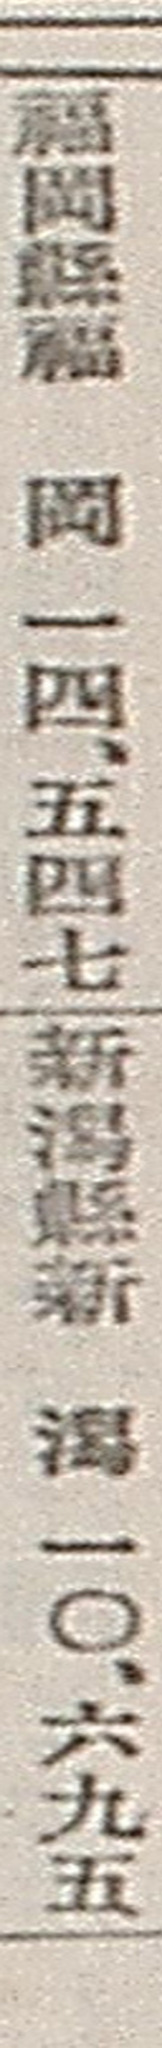福岡県福岡一四、五四七新潟県新潟一〇、六九五
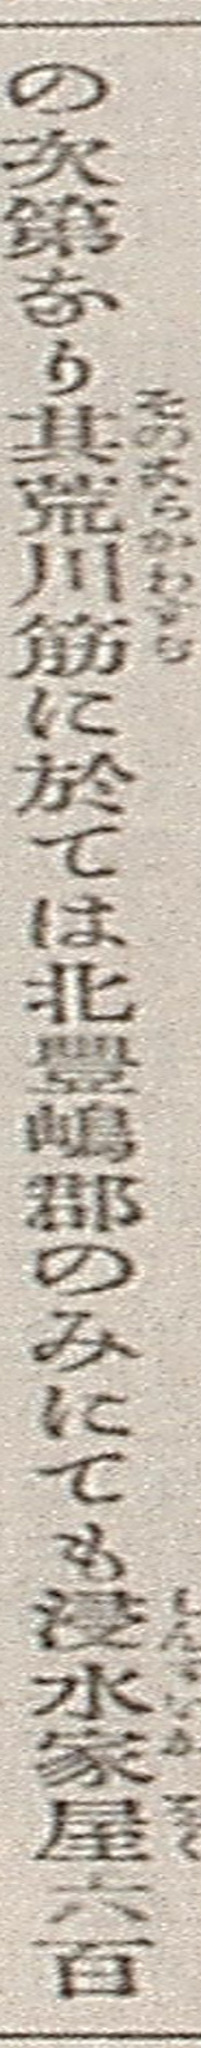の次第なり其荒川筋に於ては北豊嶋郡のみにても浸水家屋六百
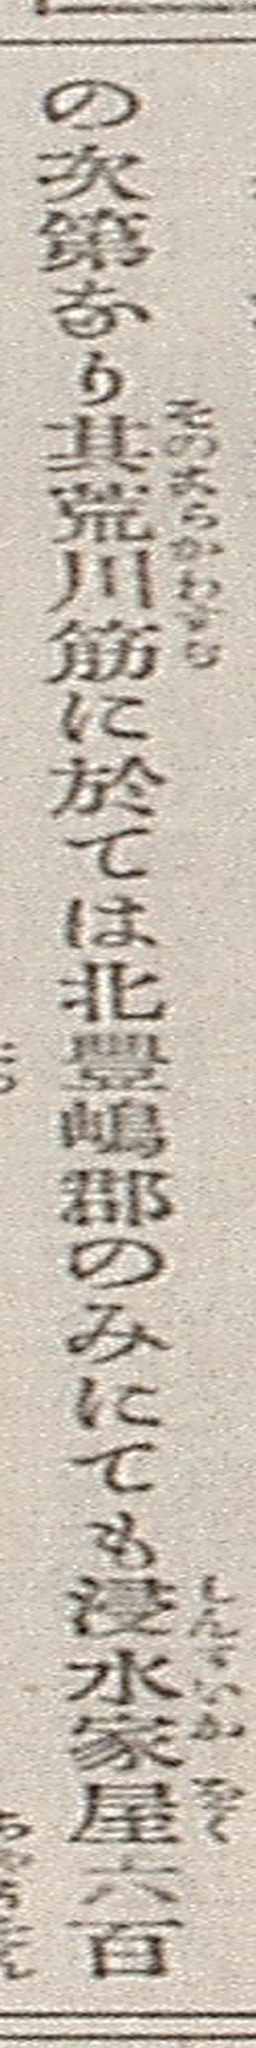の次第なり其荒川筋に於ては北豊嶋郡のみにても浸水家屋六百
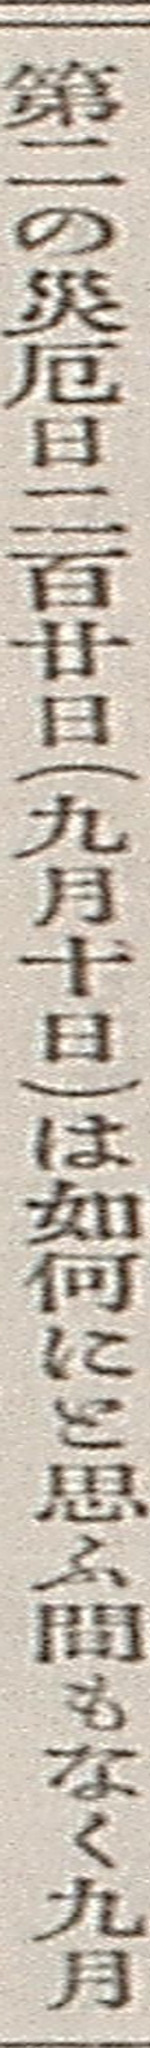第二の災厄日二百廿日は如何にと思ふ間もなく九月
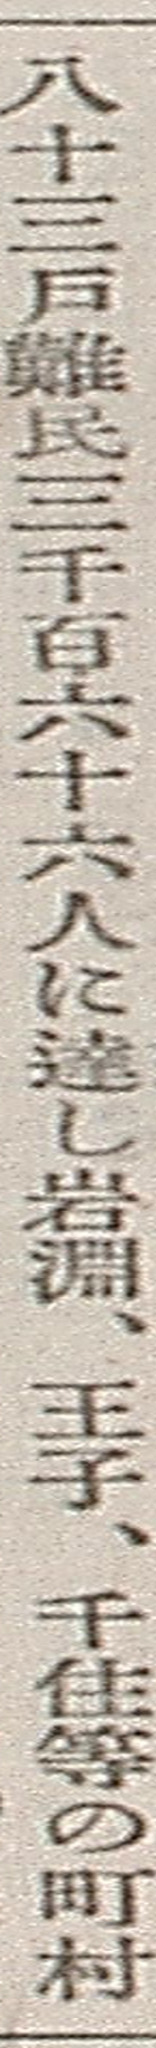八十三戸難民三千百六十六人に達し岩淵、王子、千住等の町村
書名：風俗畫報臨時増刊第百二十四號　洪水地震被害録（上）
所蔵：東京大学地震研究所図書室 Earthquake Research Institute Library, The University of Tokyo, JAPAN
